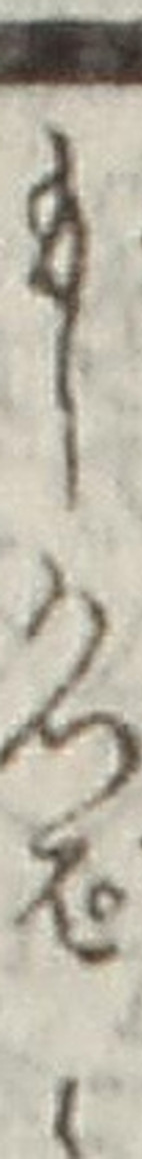もしかつぱ
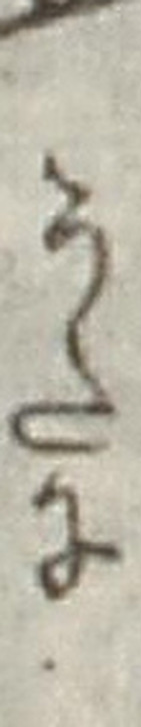うたに
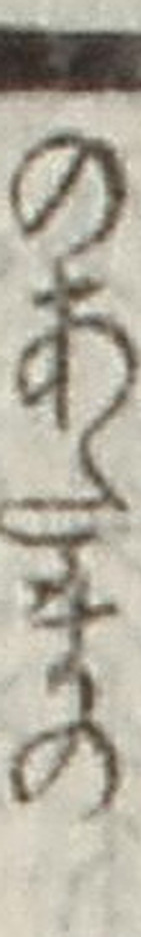のあたまの
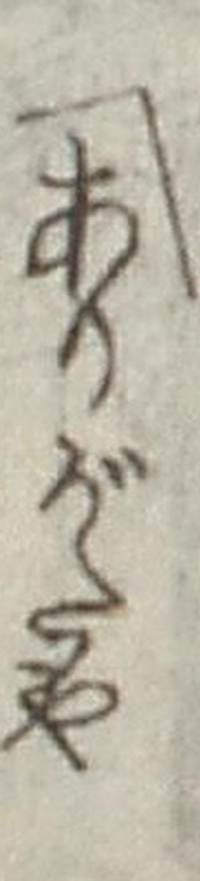〽ありがたや
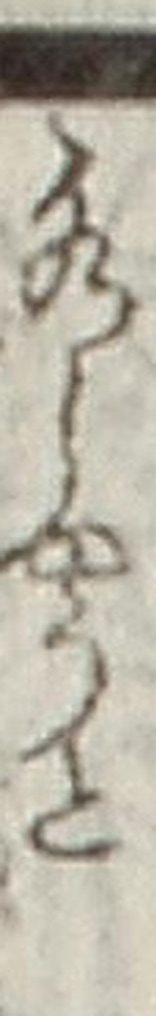水しやうと
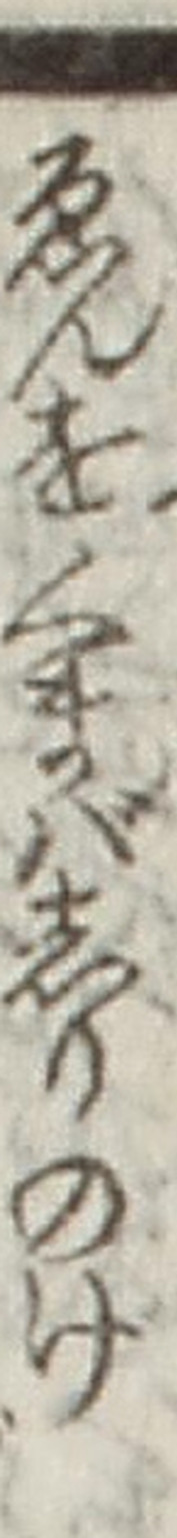ゑんをくまばしりのけ
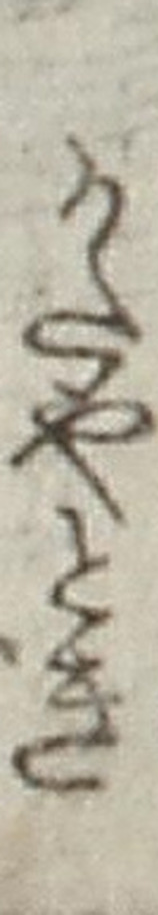かたやとき
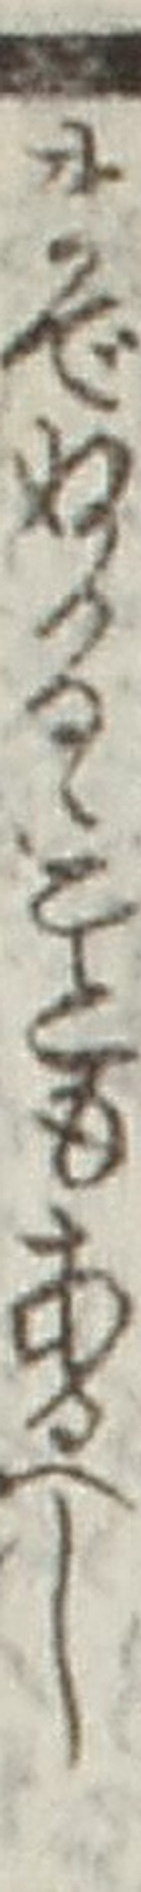までぬかるゝこともあるべし
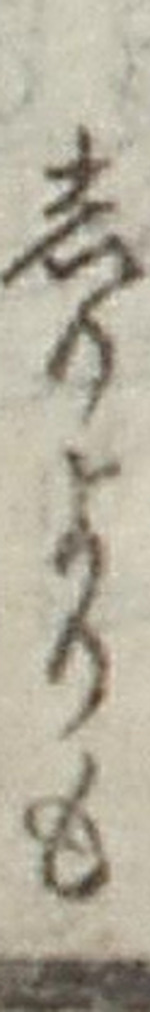しりよりも
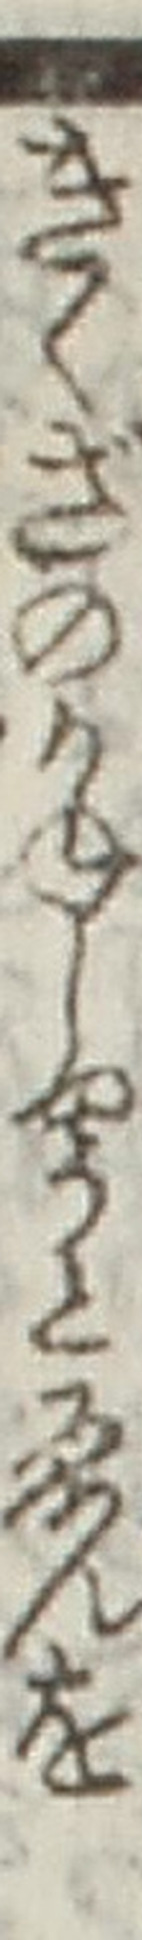きくざのかねしやうとゑんを
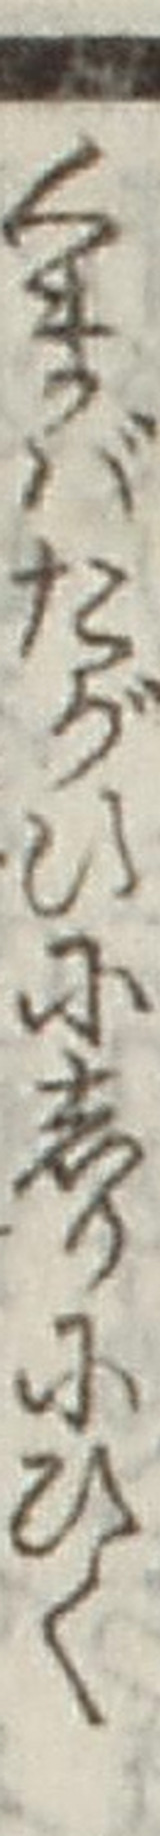くまばたがひにしりにひく
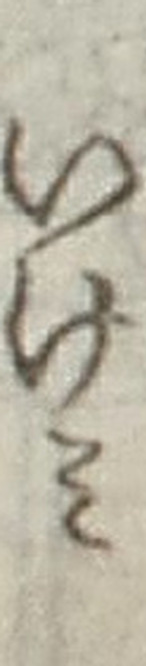いけみ
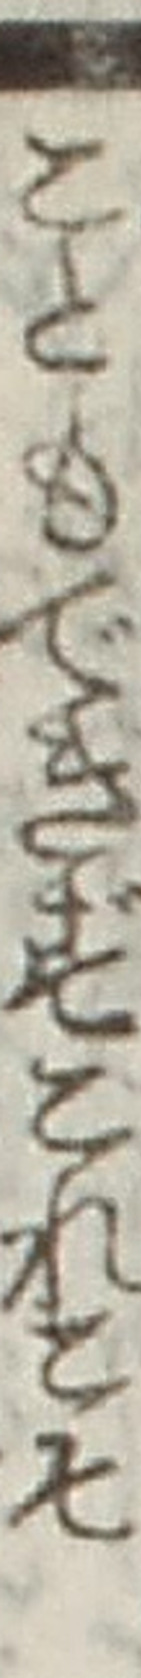こともできずこれこそ
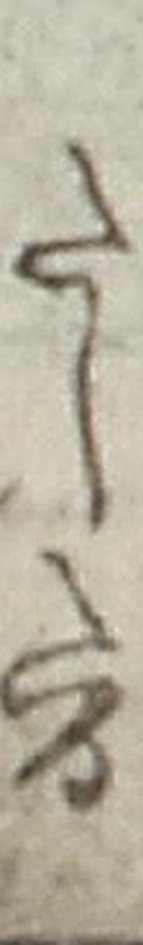たしたる
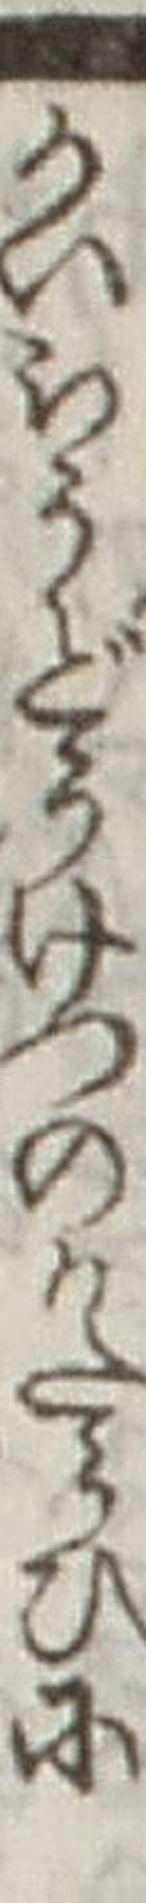かいらうどうけつのかたらひに
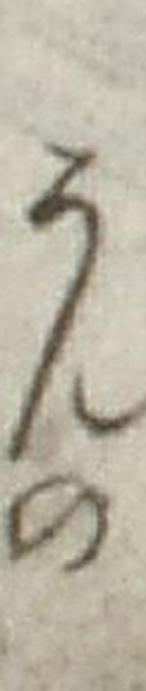うんの
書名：三世相出雲當座帳　上下冊
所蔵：東京大学地震研究所図書室 Earthquake Research Institute Library, The University of Tokyo, JAPAN
